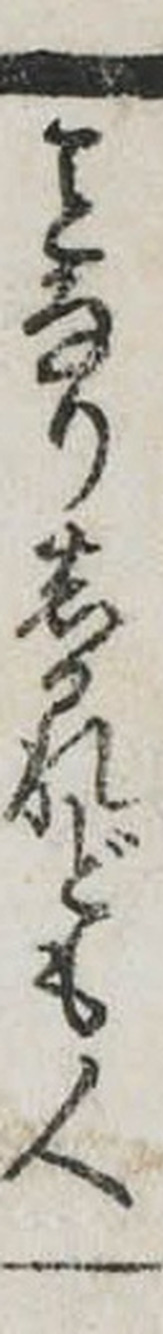ことなりしかれども人
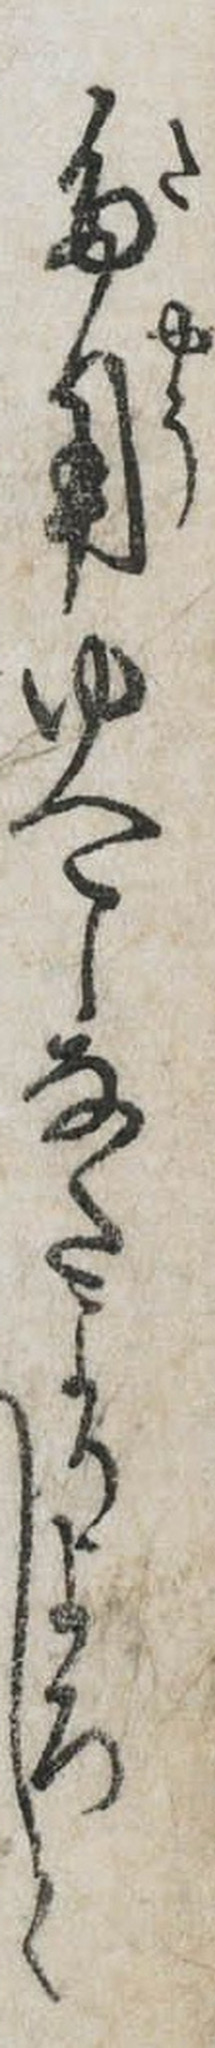多用ゆへこなたよりよろしく
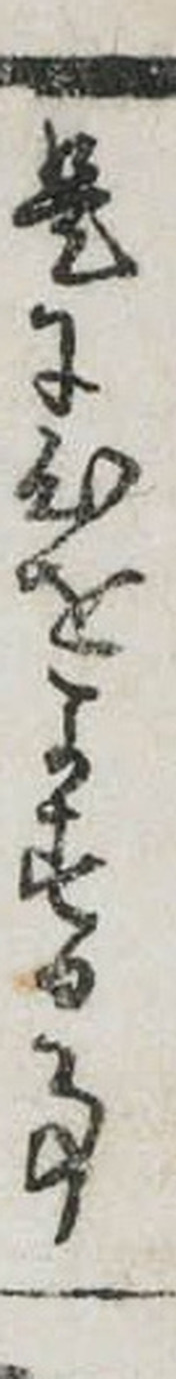是に心をよする事
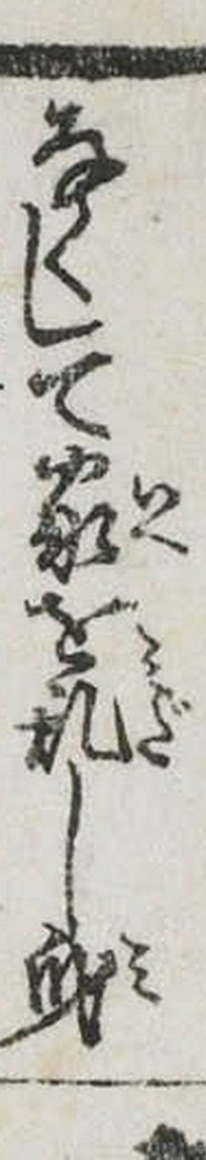なくして家を乱し身
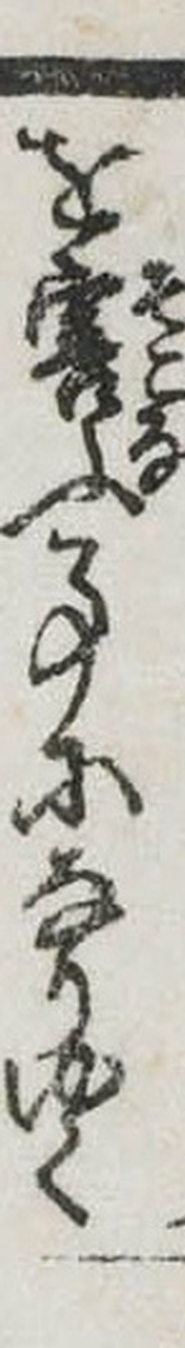を害ふ事になりゆく
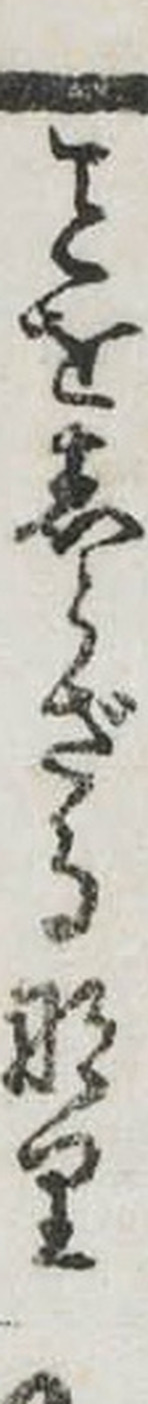ことをしらざるなり
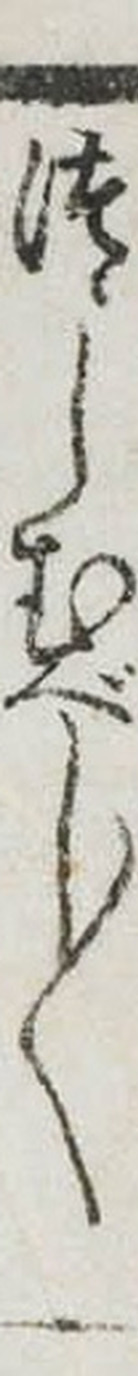つゝしむべし〳〵
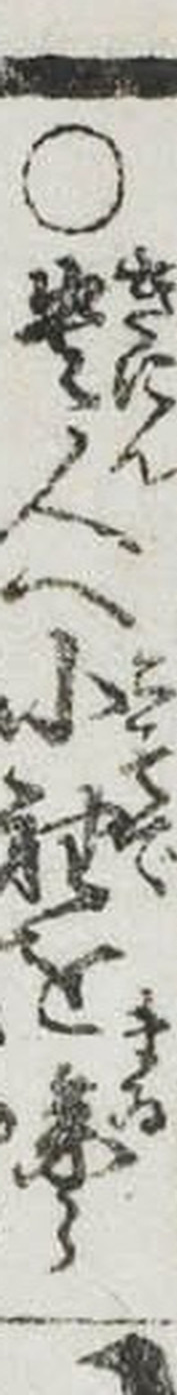○貴人へ小袖を参ら
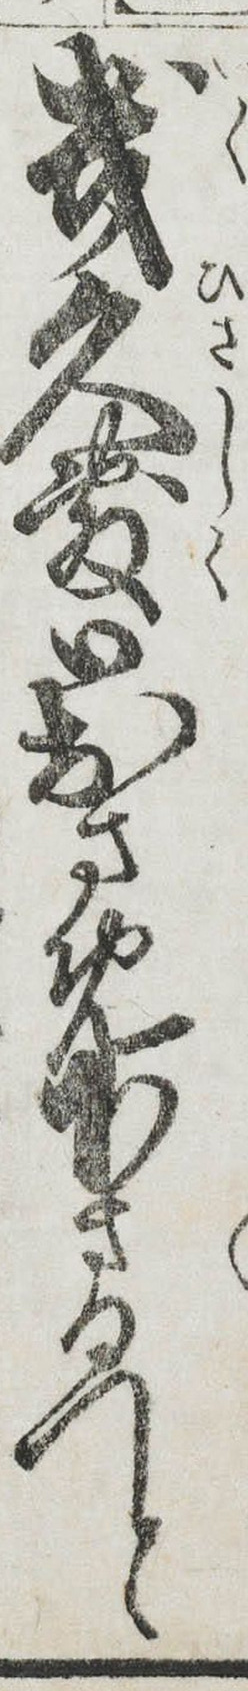幾久敷御おさめ下さるへく候
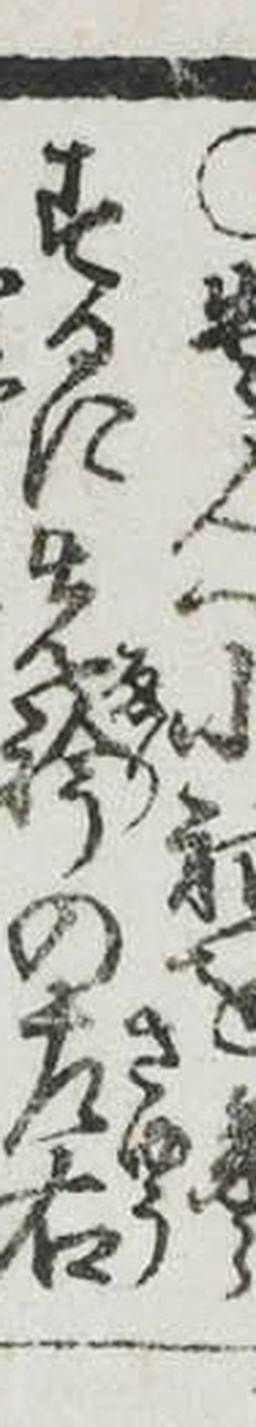するに先衿の左右
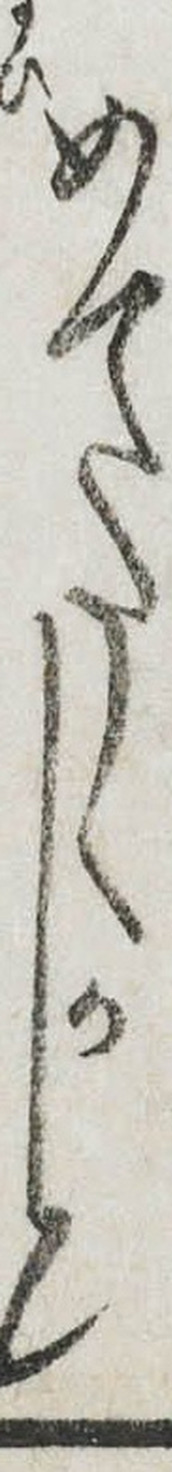めてたくかしく
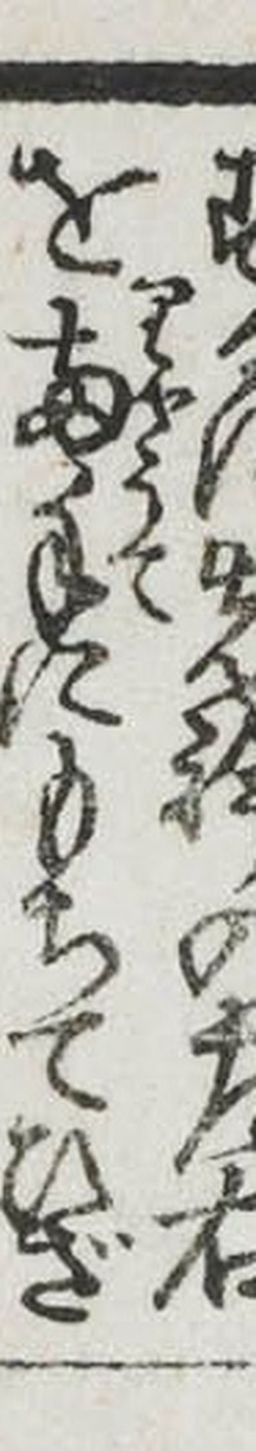を両手にもちてひざ
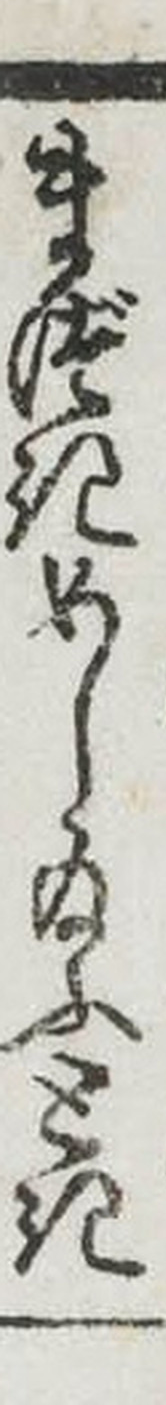まづきめし給ふとき
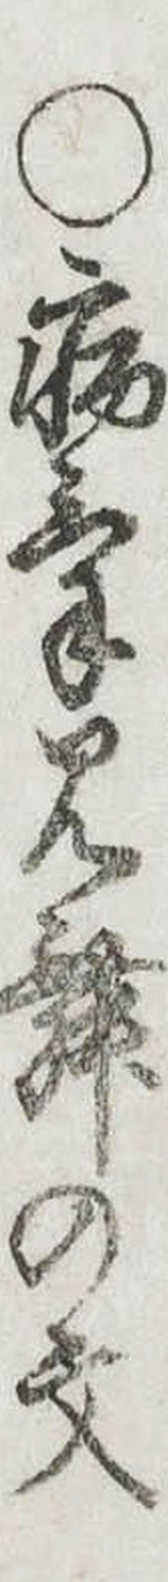○病気見舞の文
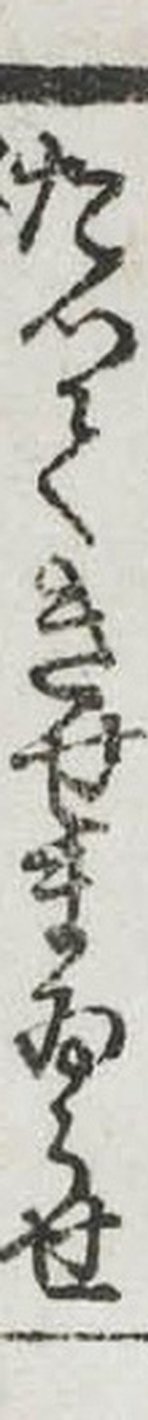たつてきせまゐらせ
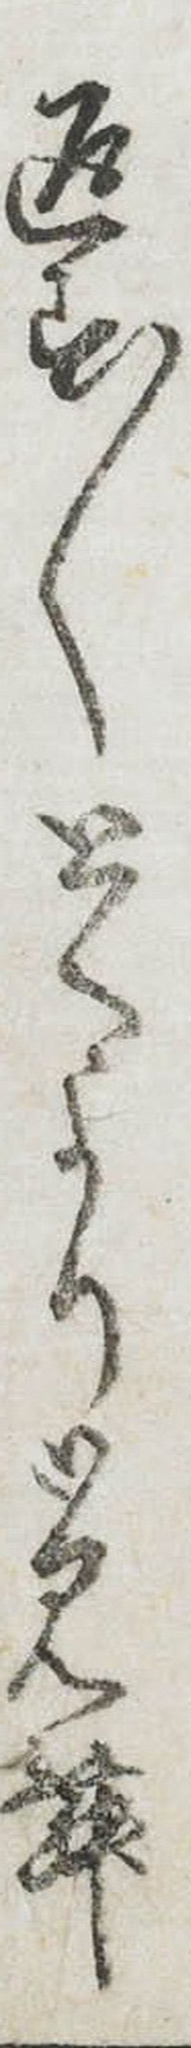返す〳〵とくより御見舞
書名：頭書萬用婦人手紙之文言
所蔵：東京学芸大学教育コンテンツアーカイブ
